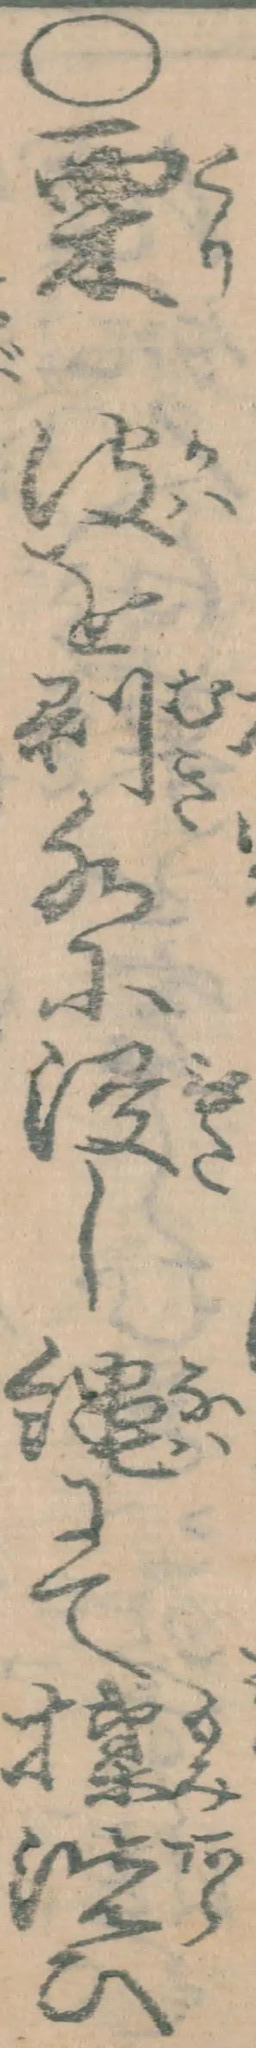〇栗皮を剥水に浸し縄にて揉洗ひ
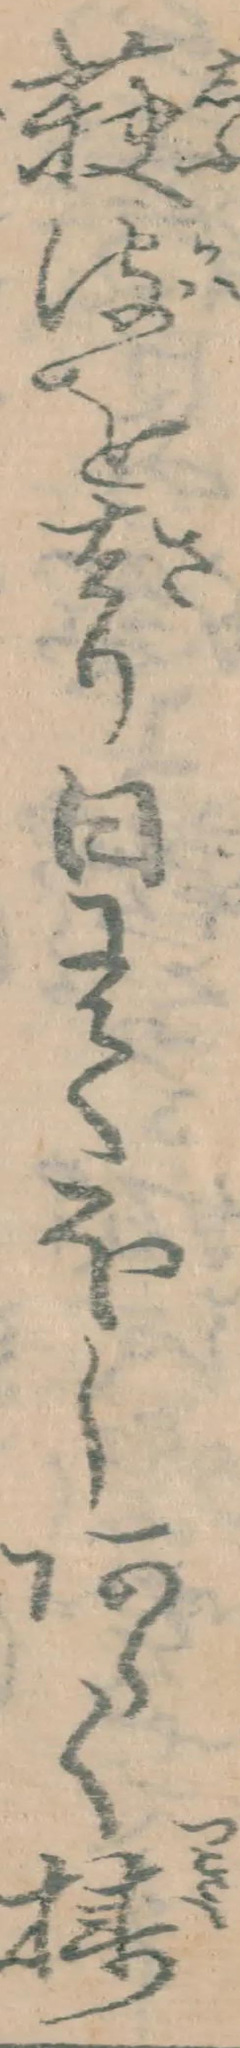萩皮を去り日にてほしあらく擣
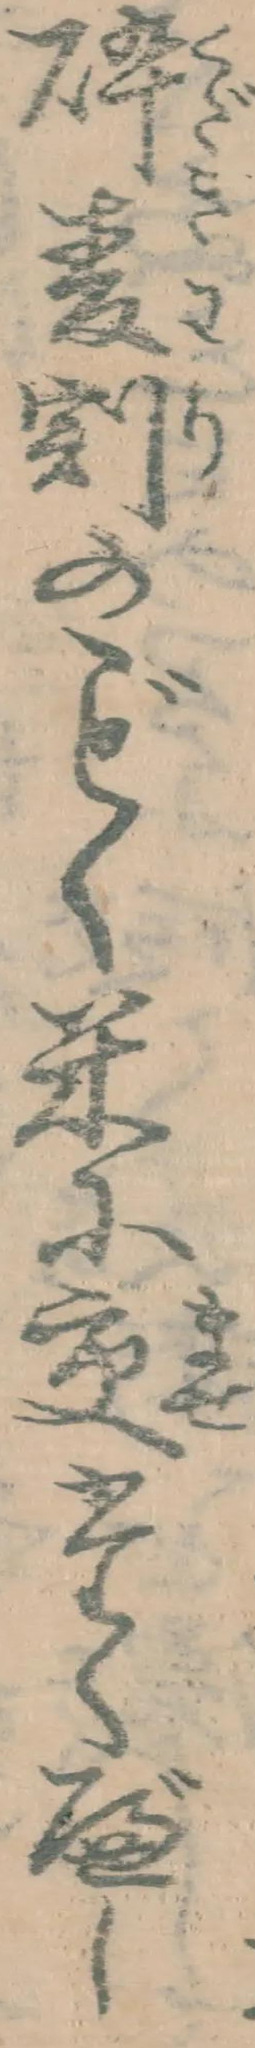砕麦割のごとく米に交たくべし
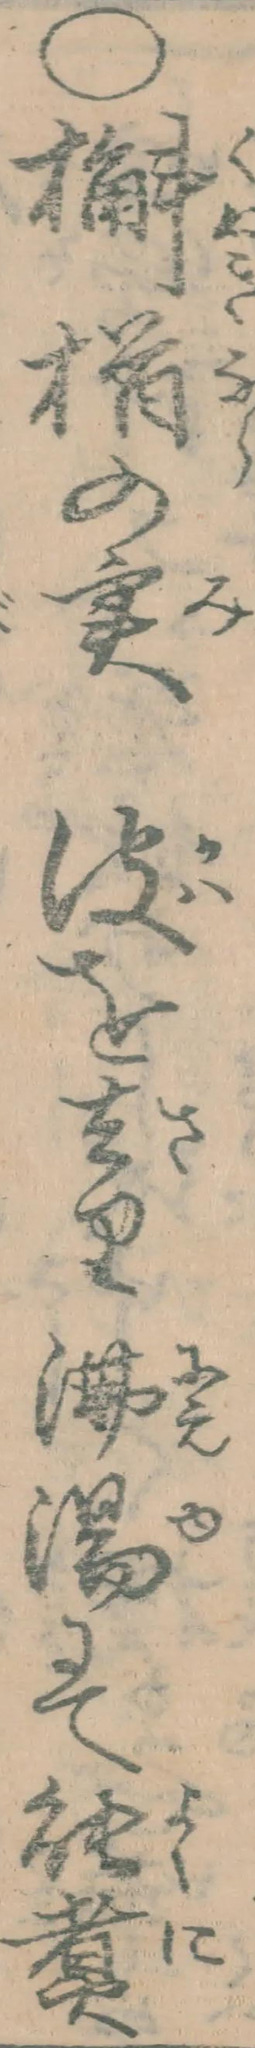〇檞楢の実皮を去り沸湯にて能煮
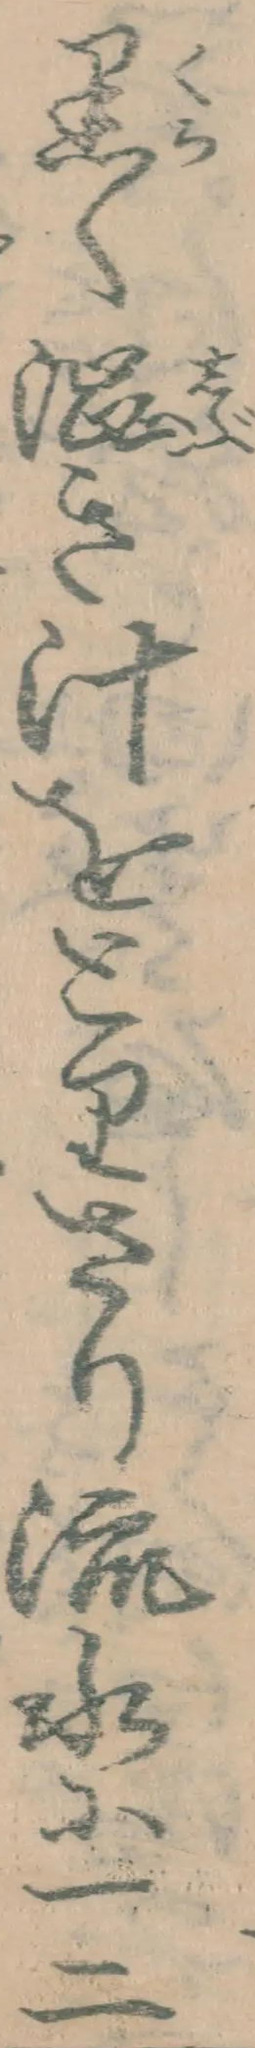黒く渋き汁をとりさり流水に一二
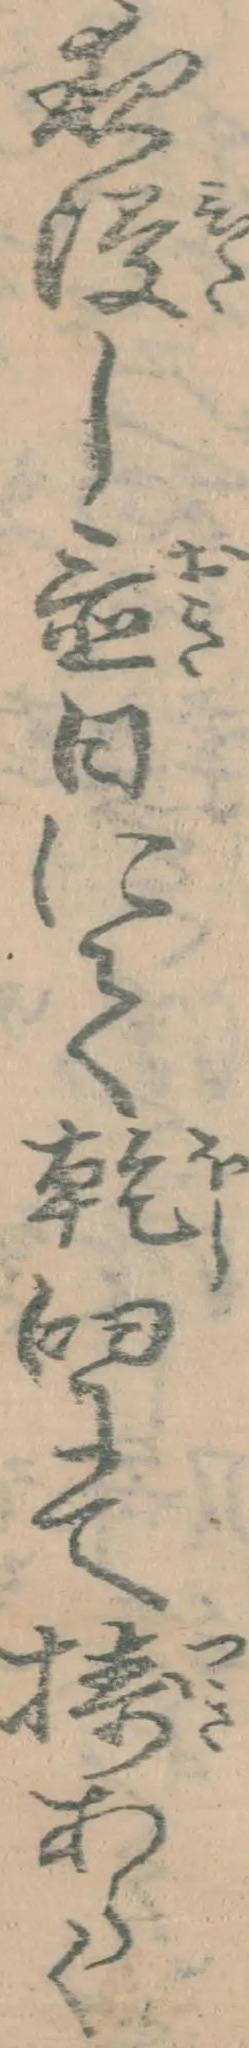夜浸し置日にて乾臼にて擣あらく
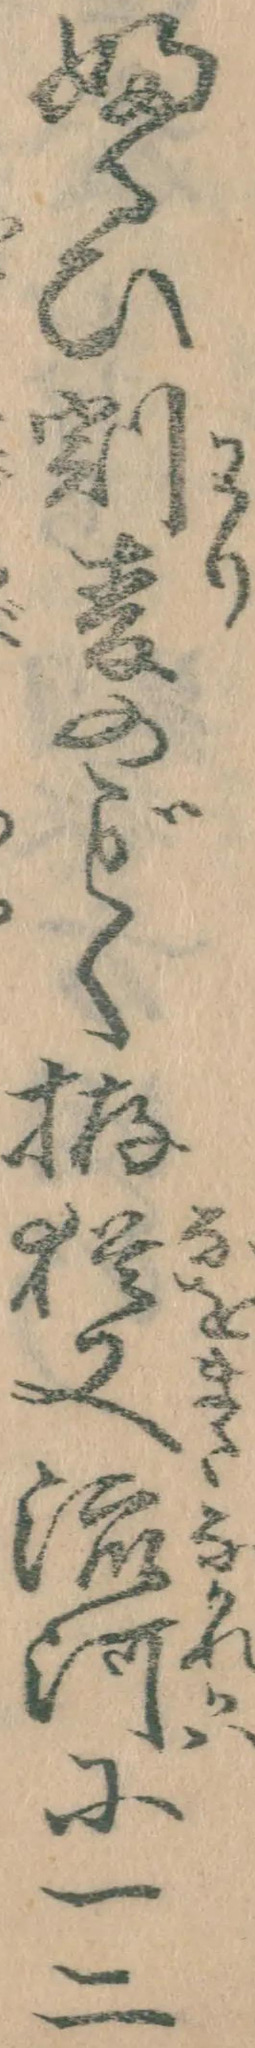ふるい割麦のごとく拵猶又流河に一二
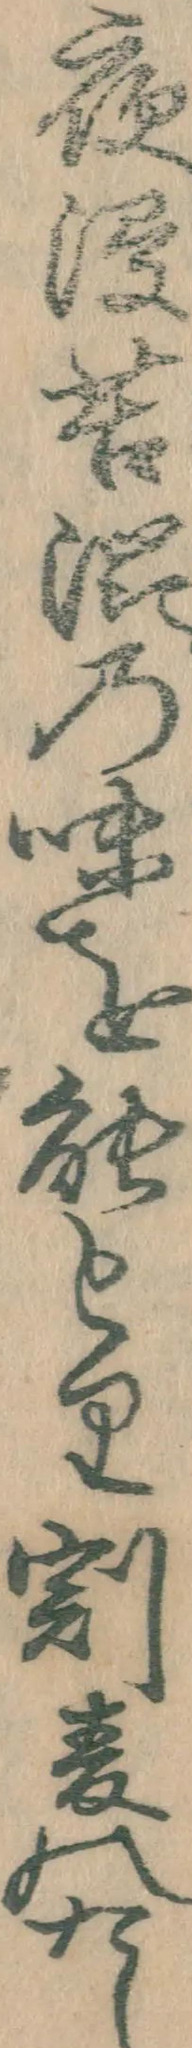夜浸苦渋の味を能とり割麦のたし
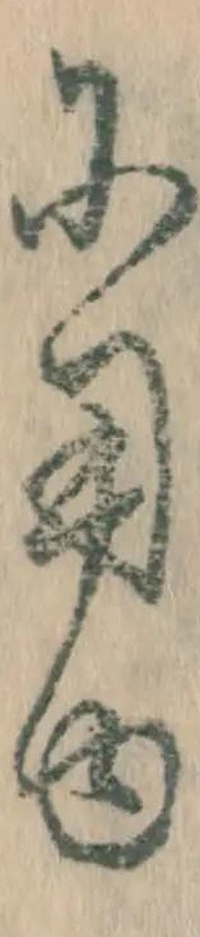に用ゆ
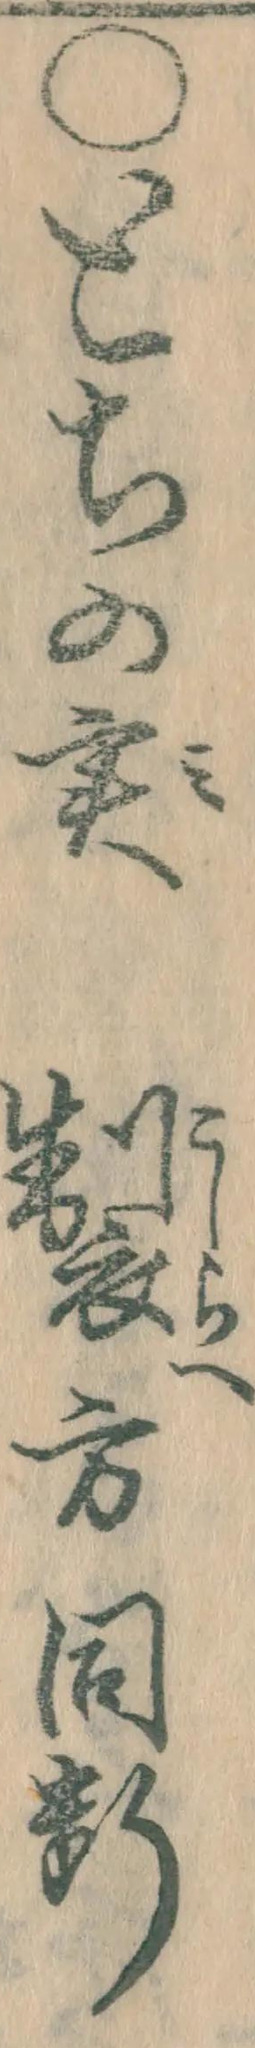〇とちの実製方同断
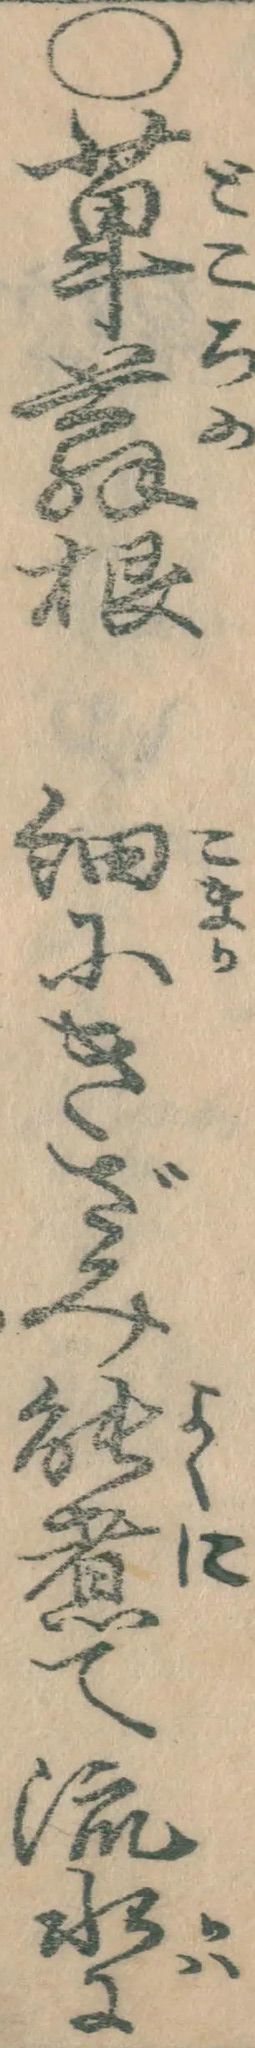〇萆蒻根細にきざみ能煮て流水に
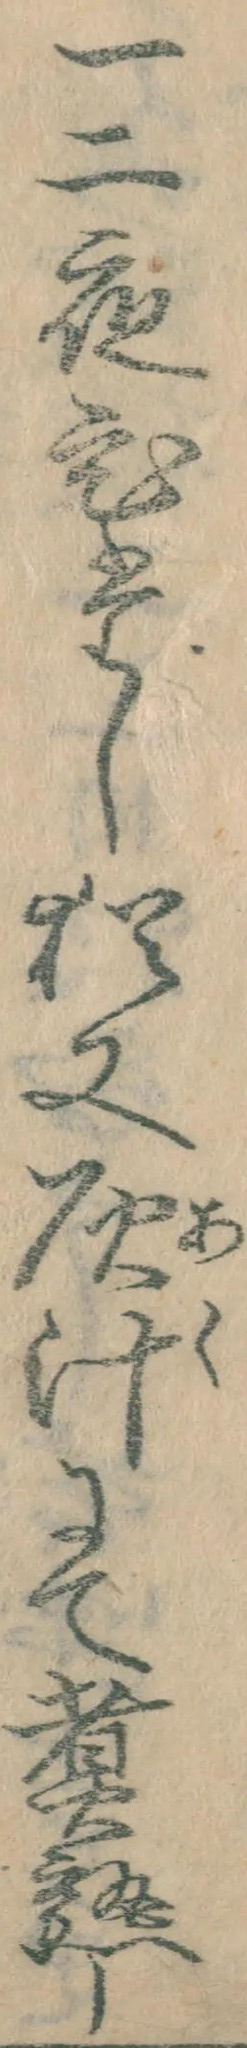一二夜ひたし猶又灰汁にて煮熟し

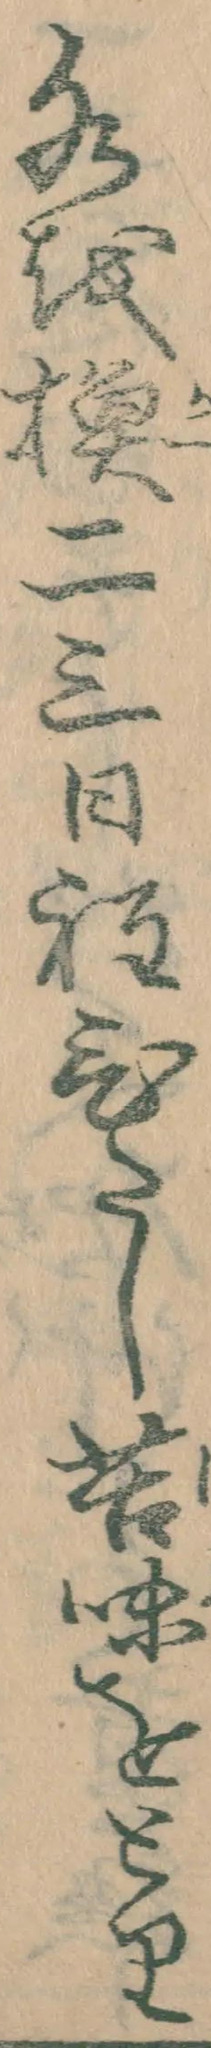水を換ニ三日程ひたし苦味をとり
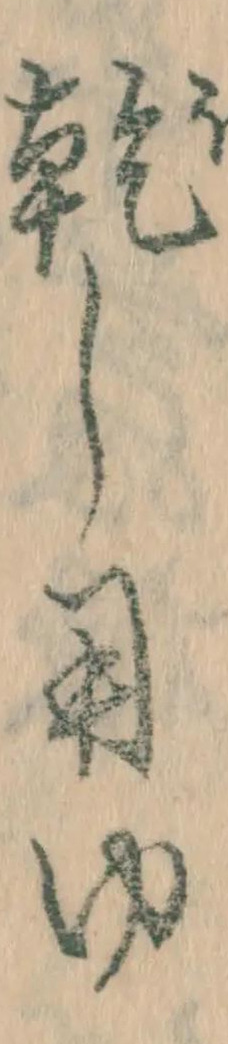乾し用ゆ
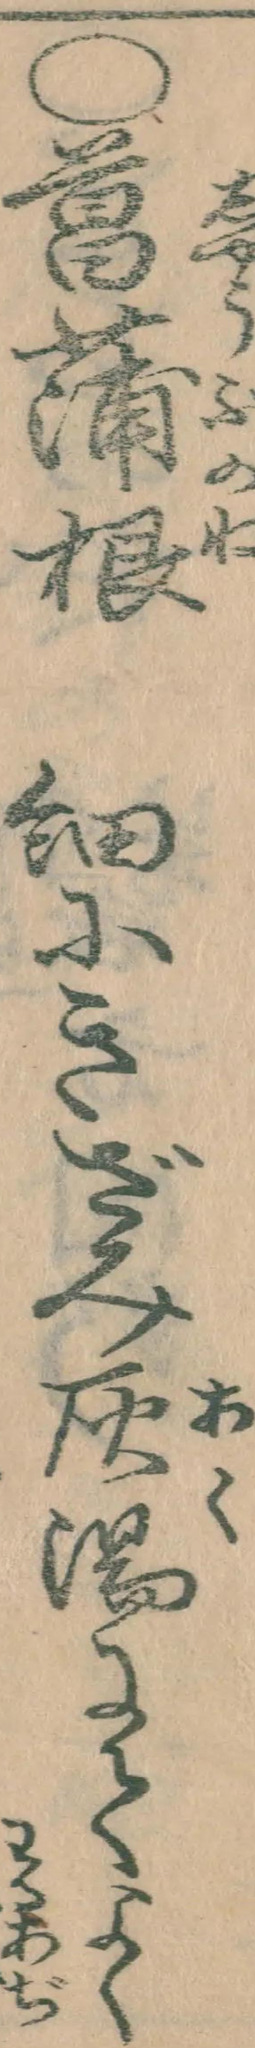〇菖蒲根細にきざみ灰湯にてよく
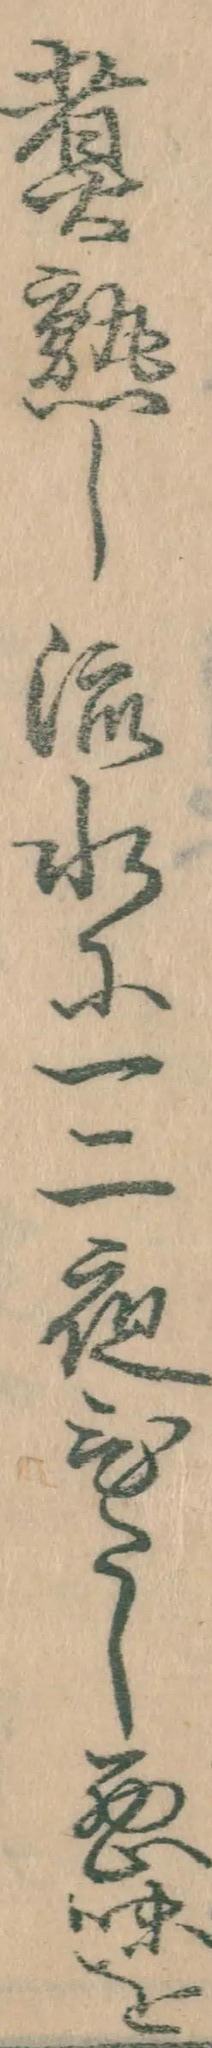煮熟し流水に一二夜ひたし悪味を
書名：救荒鄙諭
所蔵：国立国会図書館 National Diet Library, JAPAN
